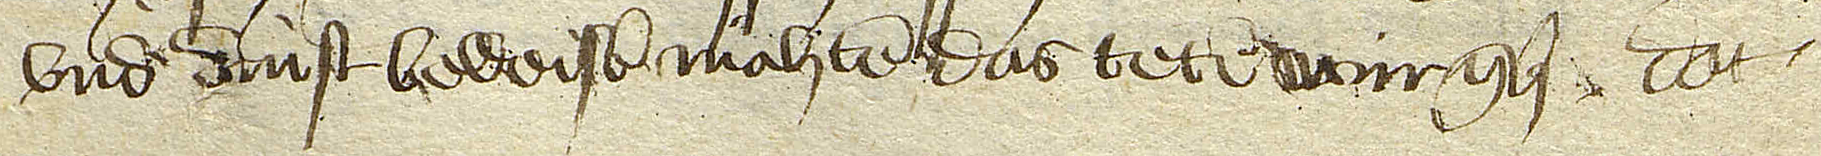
vnd dinſt beweiſe* möhte* das tete* wir gn* . dat /
